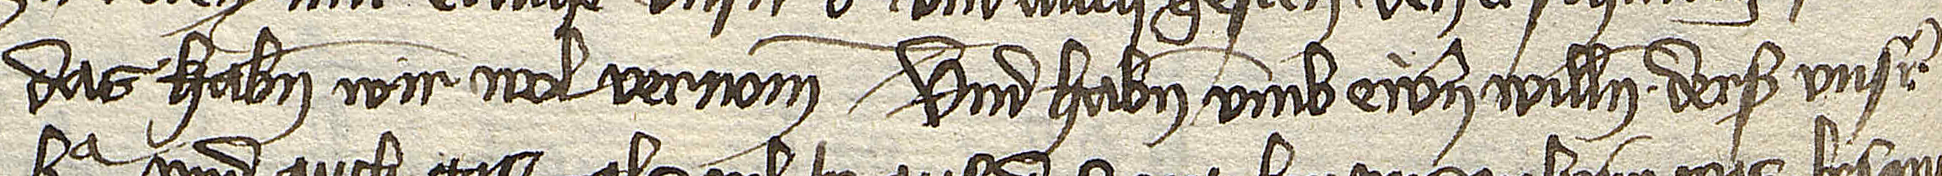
Das habn* wir wol vernom* / Vnd habn* vmb eẅ*n willn* . derſ* vnſr*
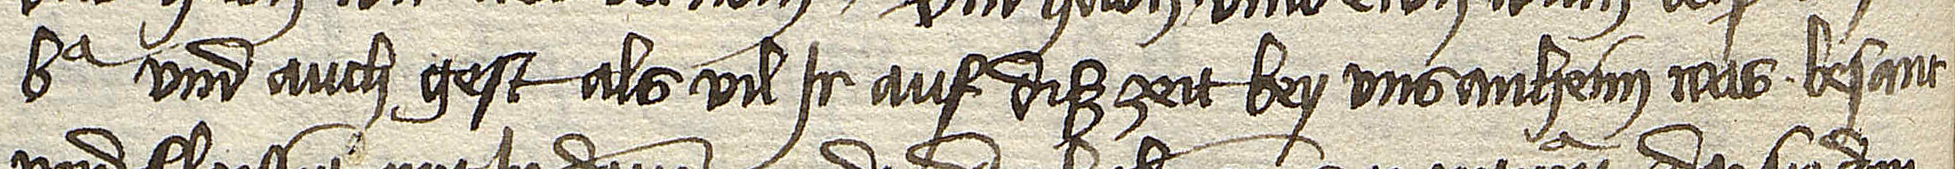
b* vnd auch geſt als vil Ir auf diſʒ ʒeit bey vns anheim was . beſant
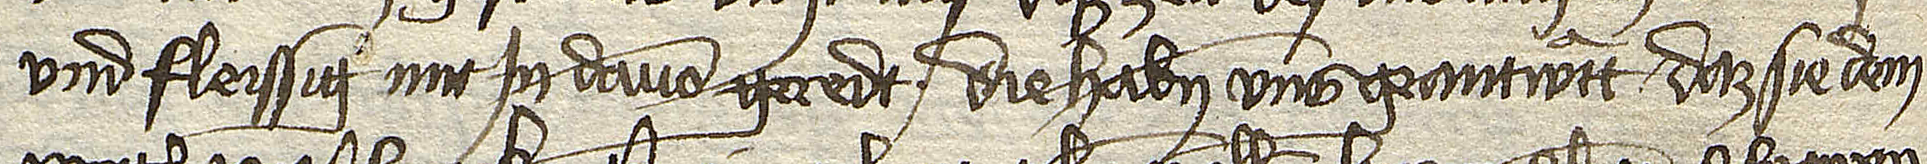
vnd fleiſſig mit In dauo* geredt . Die habn* vns geantw*tt / Daʒ ſie dem
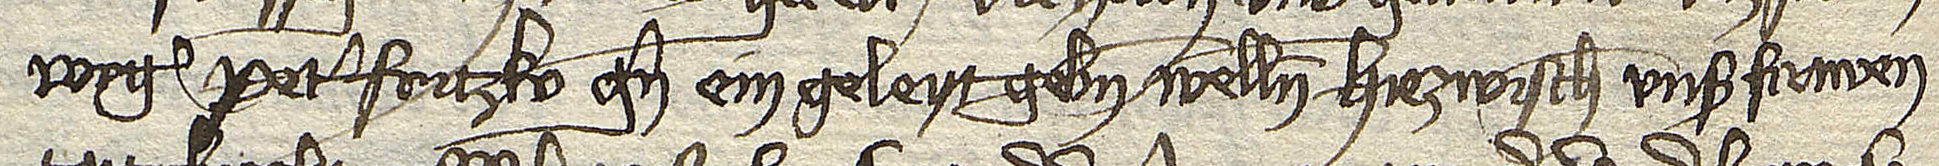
vorg* Pet* fricʒko g*n ein geleyt gebn* welln* hieʒwiſch* vnſ* frawen
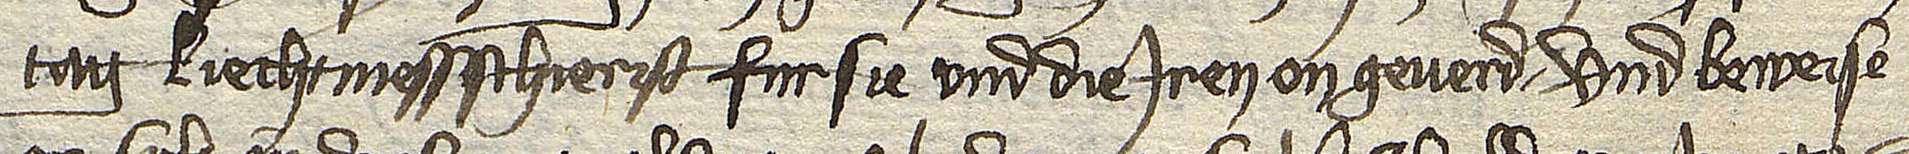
tag liechtmeſſ ſchieriſt fur ſie vnd die Iren on geuerd / Vnd beweiſe
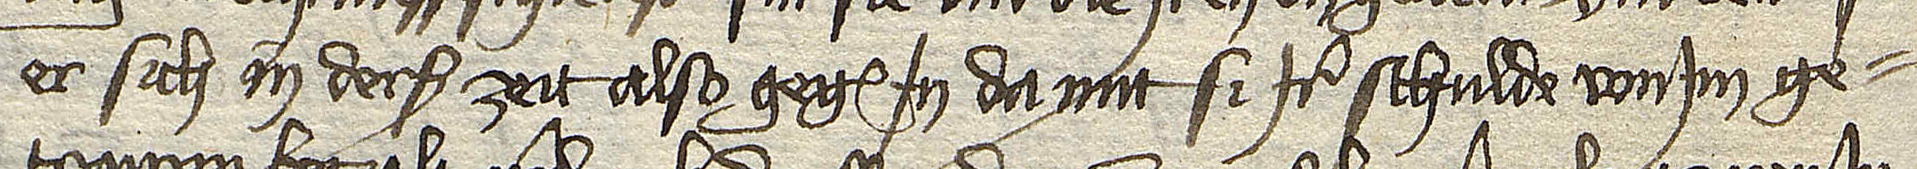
er ſich in derſ* ʒeit alſo geg* In da mit ſi Ir* ſchulde von Im ge =
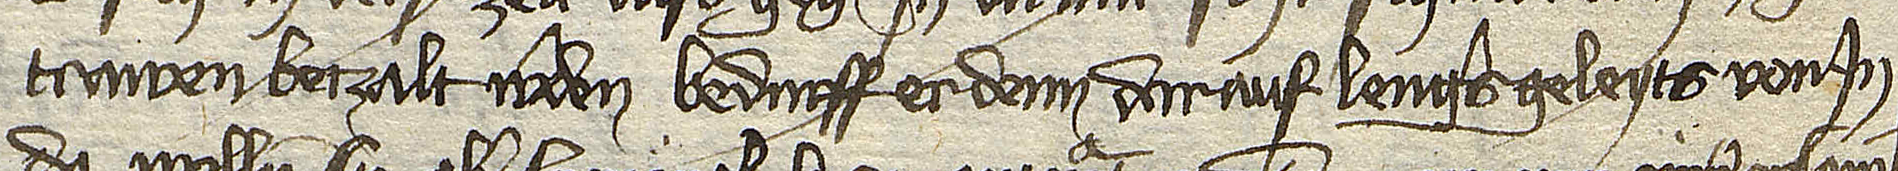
trawen becʒalt w*den bedurff er denn darauf leng*s geleyts von In
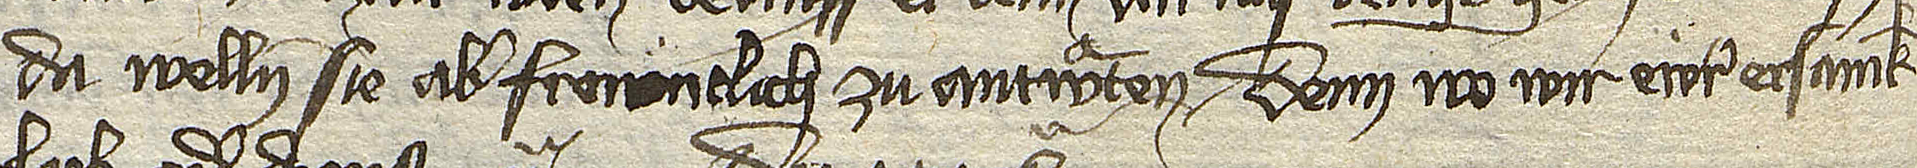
da welln* ſie ab* freẅntlich ʒu antw*ten / Denn wo wir eẅr* erſamk*
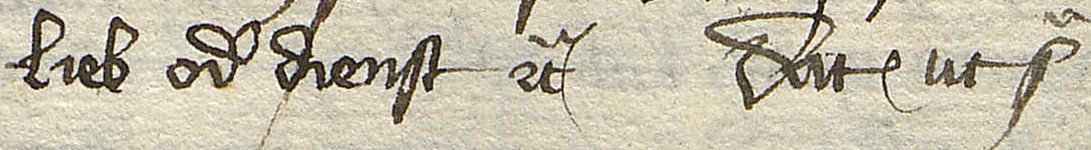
lieb od* dienſt ec* Dat* ut ſ*
